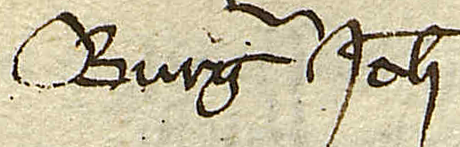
Burg* Ioh*
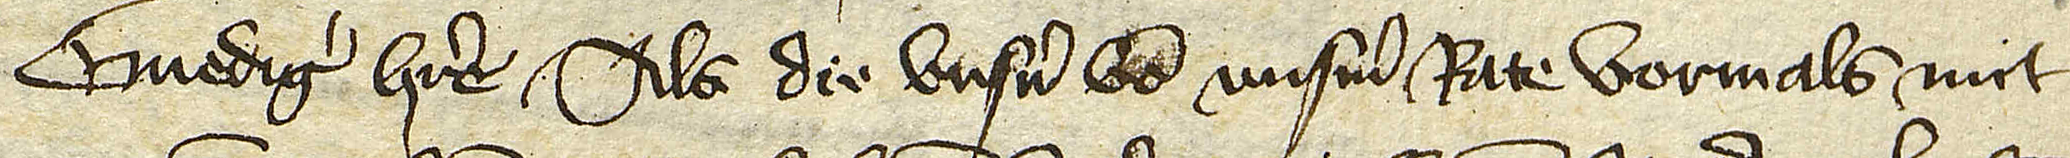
Gnedig* hr*e / Als die vnſn* vo* vnſm* Rate vormals mit
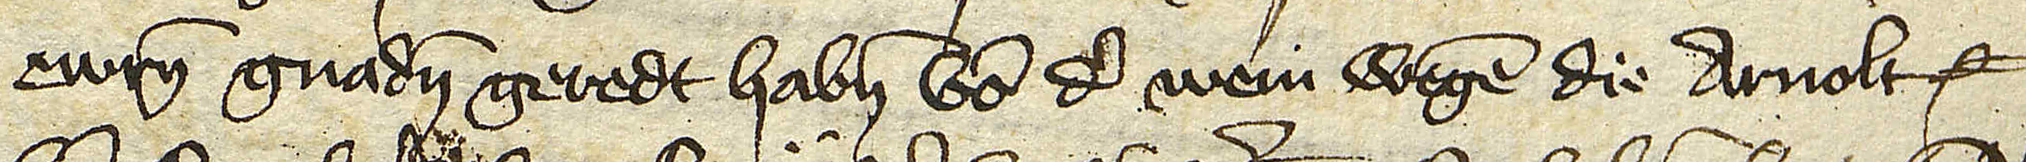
ewrn* gnadn* geredt habn* vo* d* wein wege* die Arnolt*
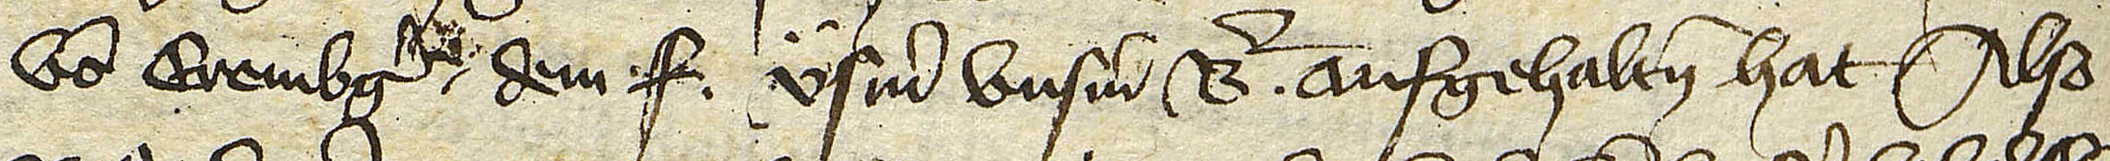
vo* Eremb*g* / dem F . V̈ſm* vnſm* B*. aufgehaltn* hat / Alſo
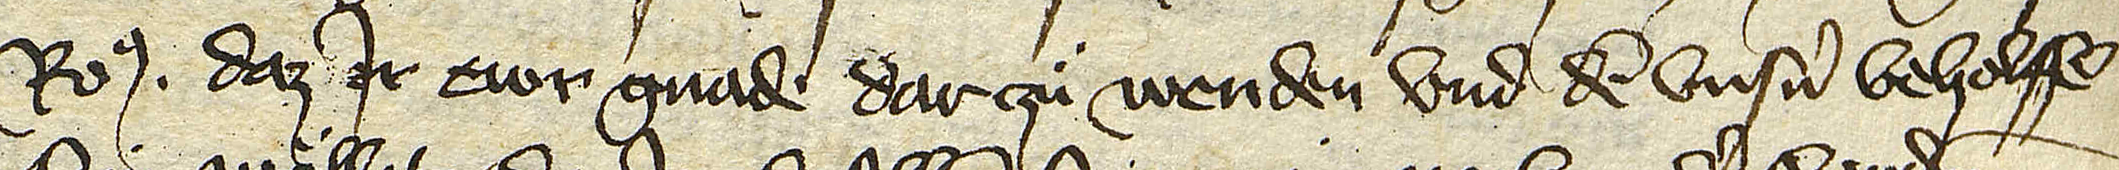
Ro* . daʒ Ir ewr gnade dar cʒü wenden vnd d* vnſn* beholffe*
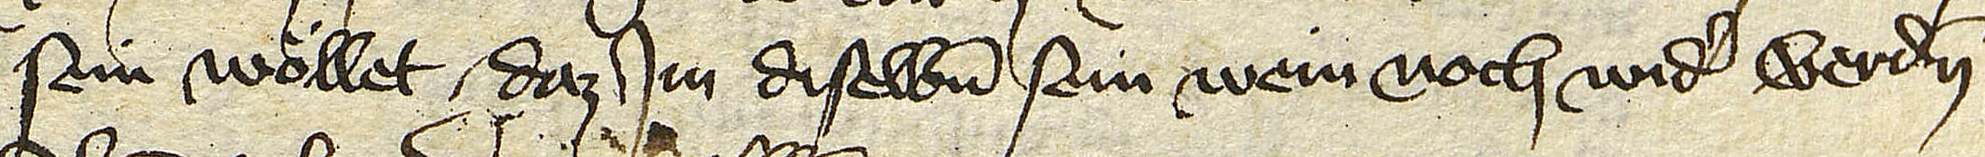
ſein wöllet / daʒ Im diſelbn* ſein wein noch wid* werdn*
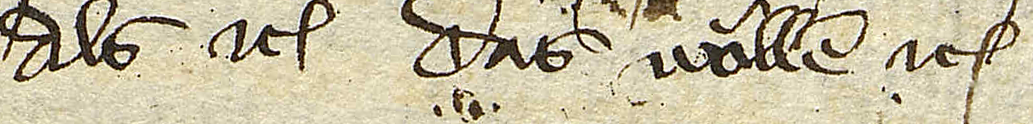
Als ec* Das wölle* ec*
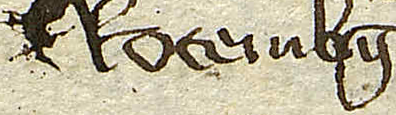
Rotemb*g
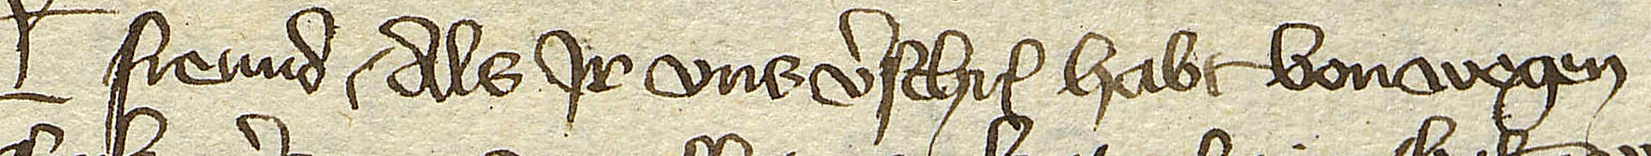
L* freund / Als Ir vns v*ſchr* habt von wegen
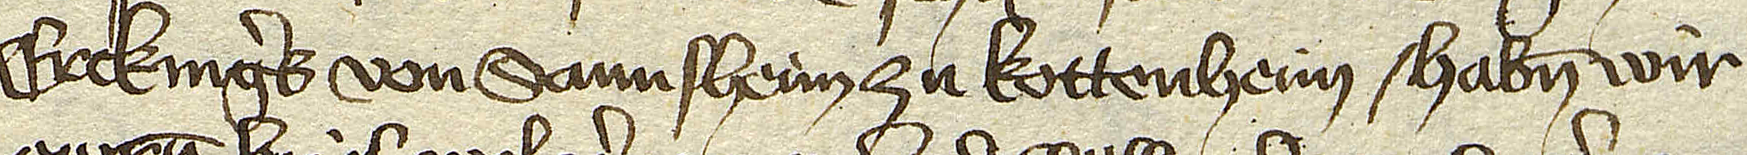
Ercking*s von Saunſheim cʒu Kottenheim / habn* wir
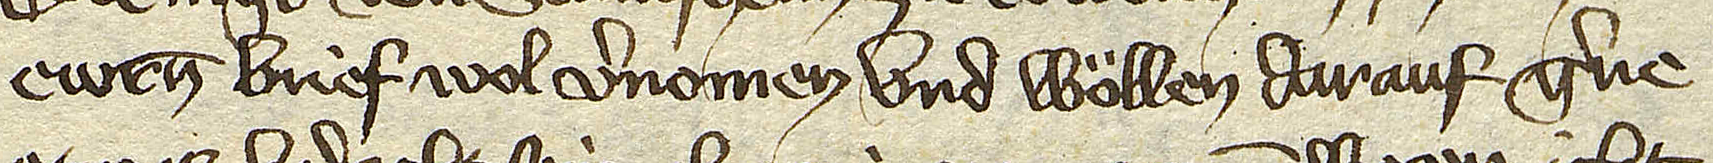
ewrn* brief wol v*nomen vnd wöllen darauf g*ne
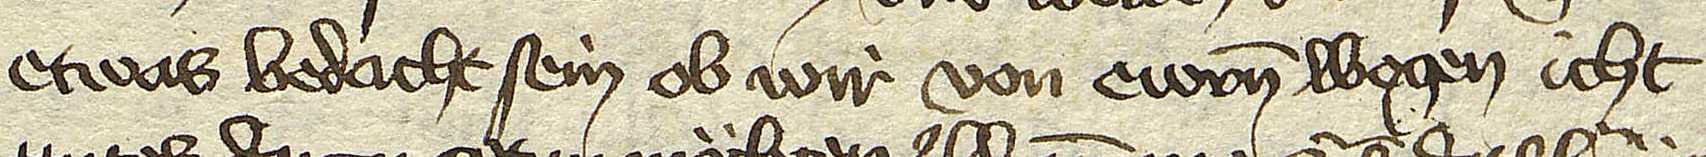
etwas bedacht ſein ob wir von ewrn* wegen icht
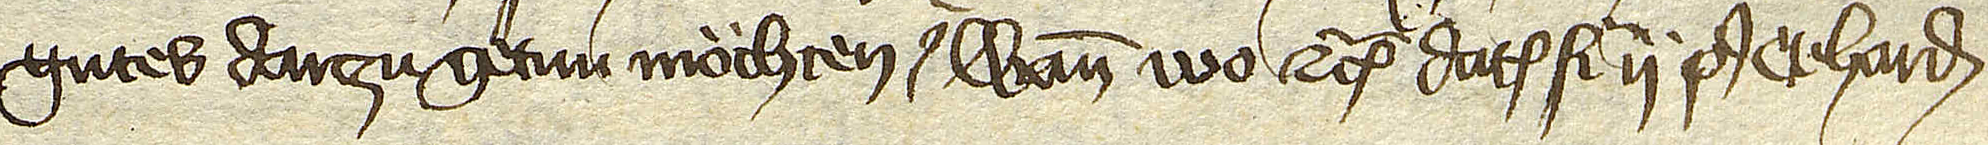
gutes darcʒu getun möchten / wan* wo* ec* dat* fi* ii* p* erhardi
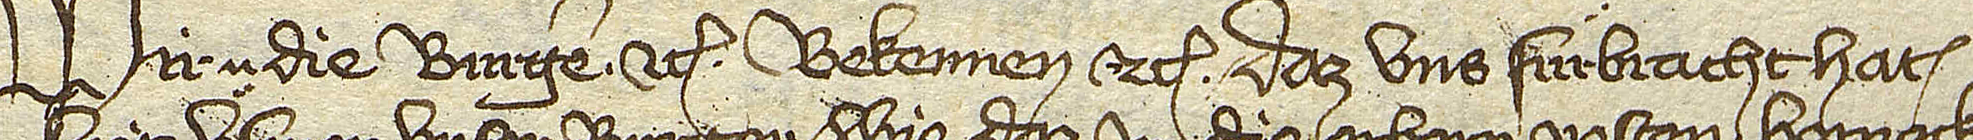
Wir ~ die Burge* . ec* . Bekennen ec*. / daʒ vns fürbracht hat /
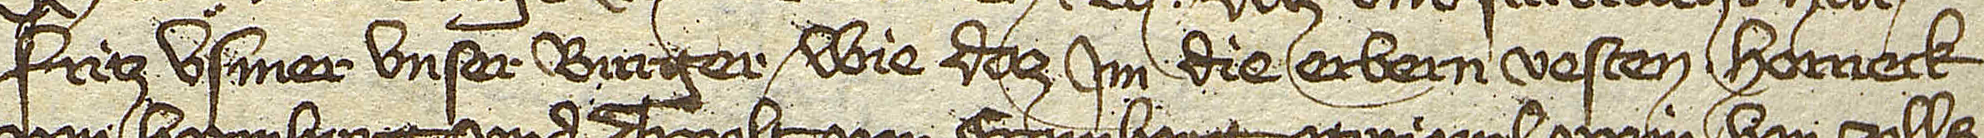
Fricʒ V̈ſmer vnſer Burger / wie daʒ Im die erbern veſten horneck
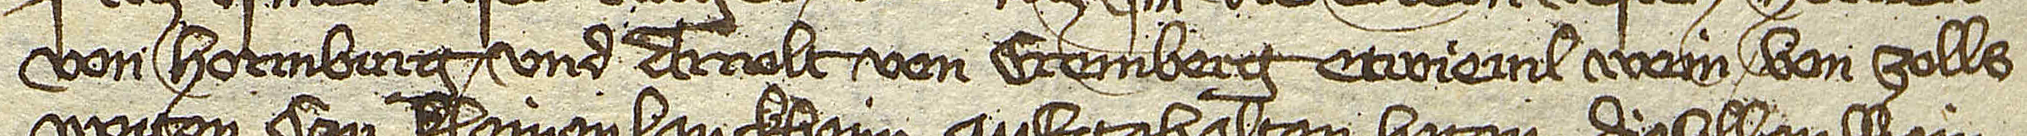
von hormburg* vnd Arnolt von Gremberg etwieil wein / von cʒolls
